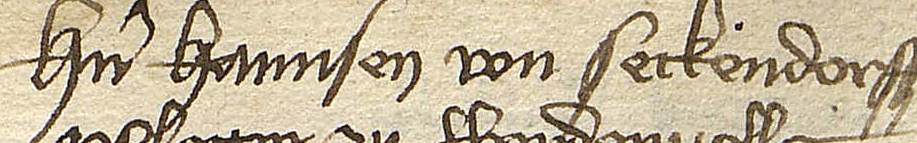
Hn* Hannſen von ſeckendorff
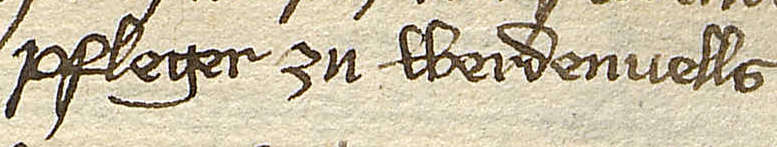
Pfleger ʒu werdenuells
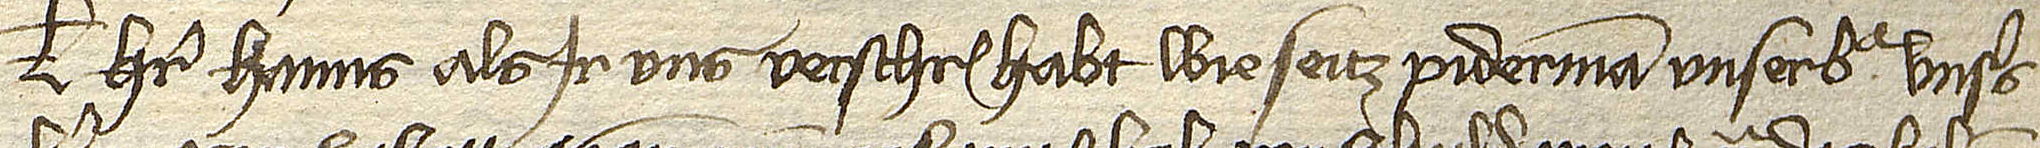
L* Hr* Hanns als Ir vns verſchr* habt wie ſeicʒ piderma* vnſer b* vnſ*s
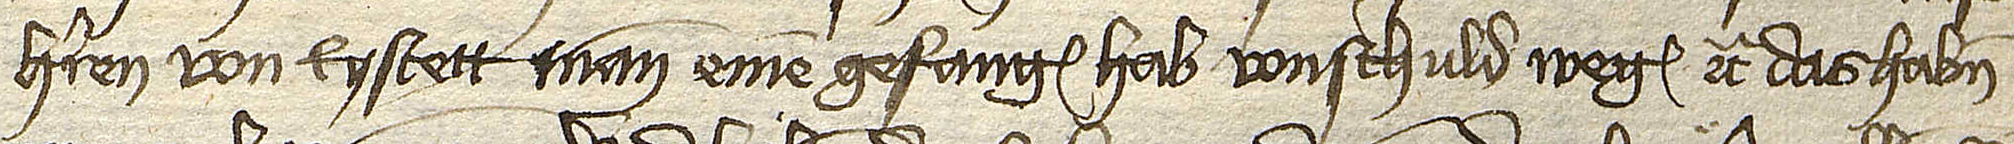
h*ren von Eyſtett man* eine* gefang* hab von ſchuld weg* ec* das habn*
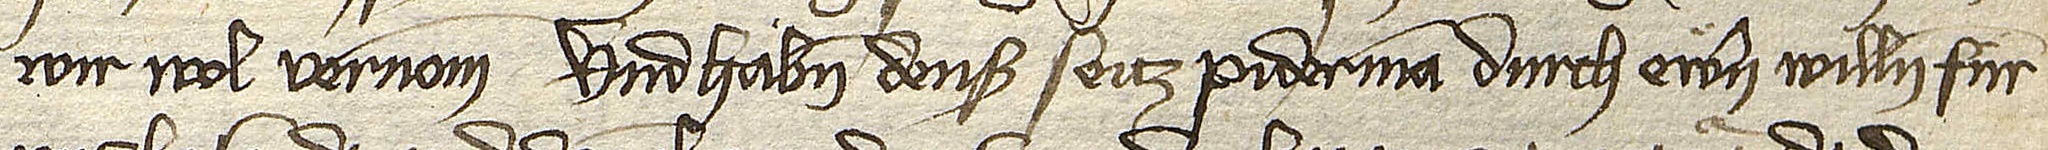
wir wol vernom* / Vnd habn* denſ* ſeicʒ piderma* durch ew*n willn* für
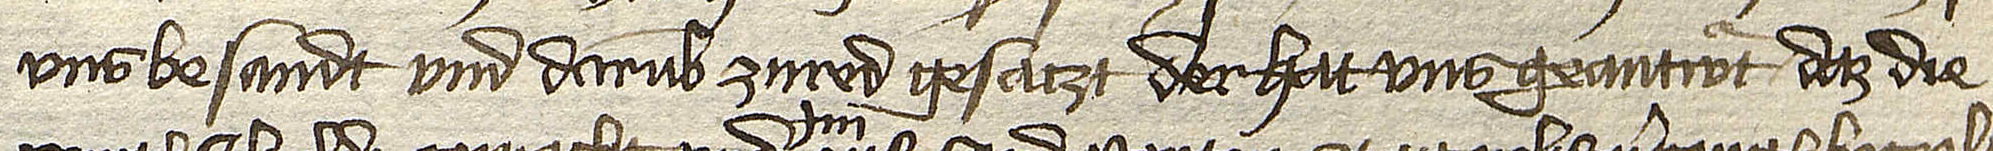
vns beſandt vnd darub* ʒured geſacʒt Der hat vns geantw*t / daʒ die
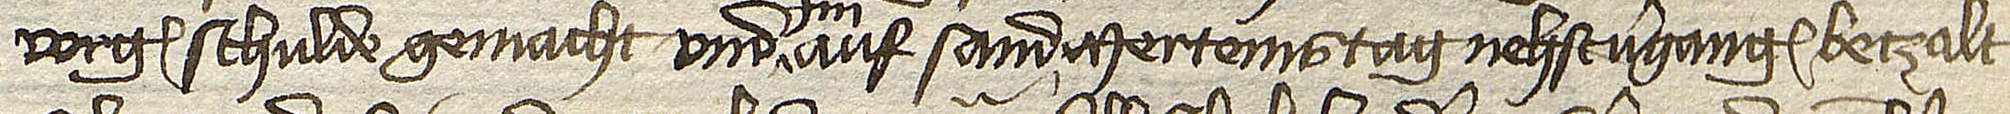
vorg* ſchulde gemacht vnd auf ſand Merteinstag nehſt u*gang* becʒalt
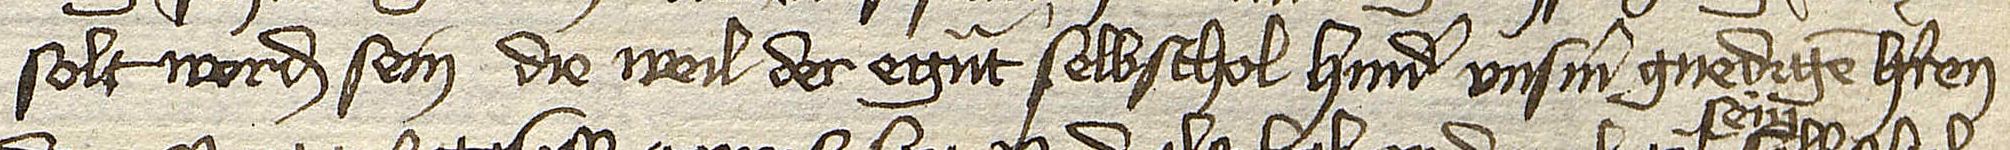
ſolt word* ſein die weil der egnt* ſelbſchol hind* vnſm* gnedige* hr*en
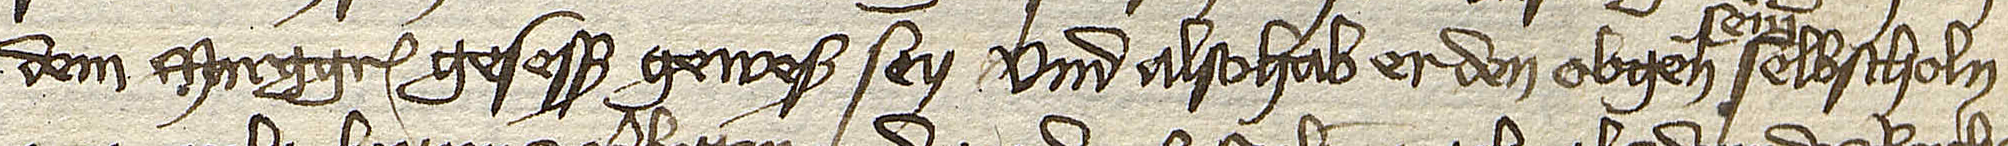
dem Marggr* geſeſſ* geweſ* ſey / Vnd alſo hab er den obgen* ſelbſcholn
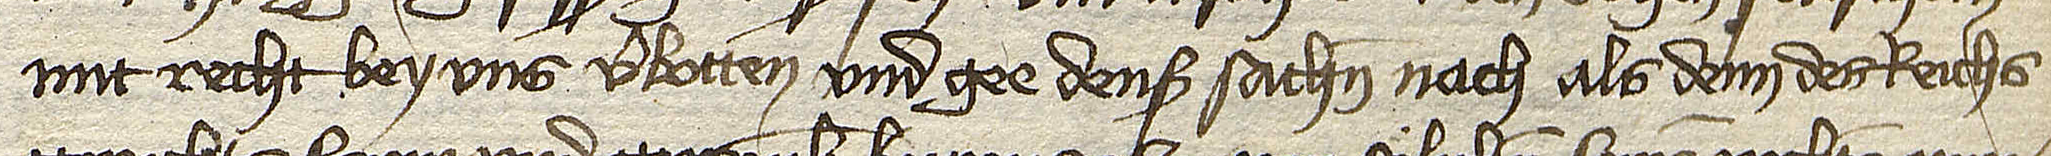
mit recht bey vns v*botten vnd gee denſ* ſachn* nach als denn des Reichs
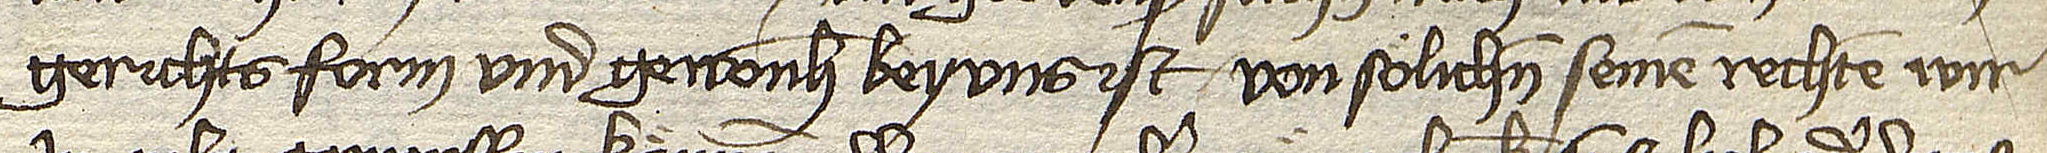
gerichts form vnd gewonh* bey vns iſt / von ſölichn* ſeine* rechte* wir
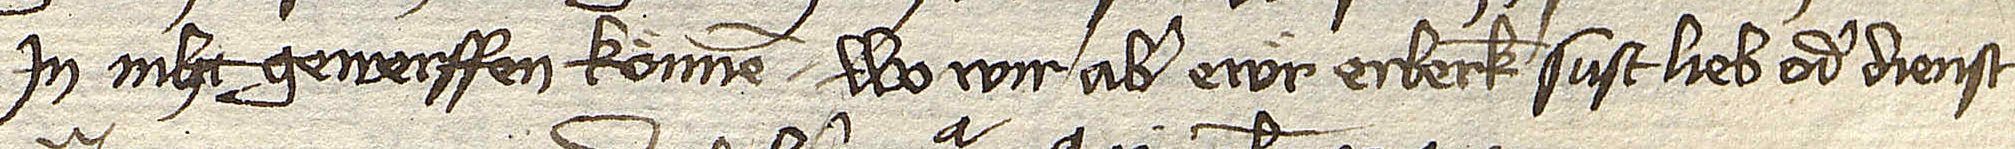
In niht gewerffen könne* / Wo wir ab* ewr erbk* ſuſt lieb od* dienſt
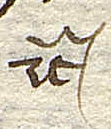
ec*
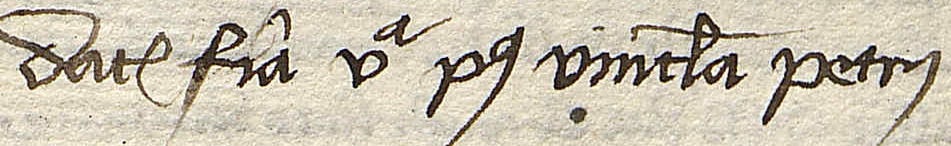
Dat* fia* v* p* vincla* Petri
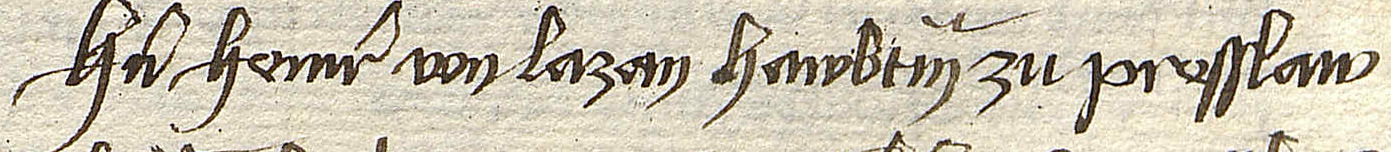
Hn* Heinr* von laʒan hawbtm* ʒu Preſſlaw
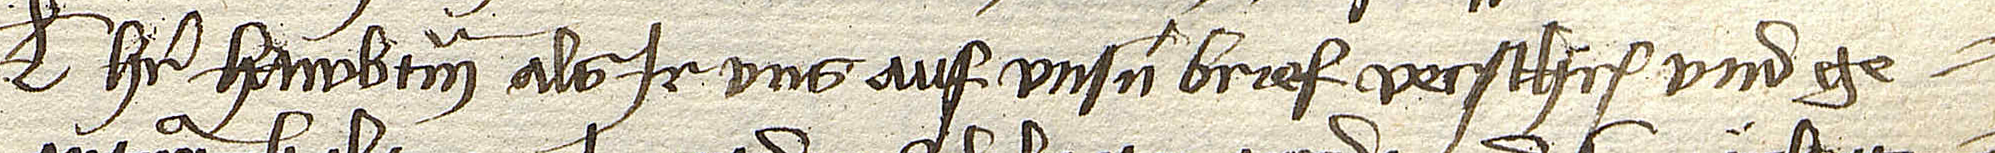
L* hr* Hawbtm* als Ir vns auf vnſn* brief verſchr* vnd ge =
